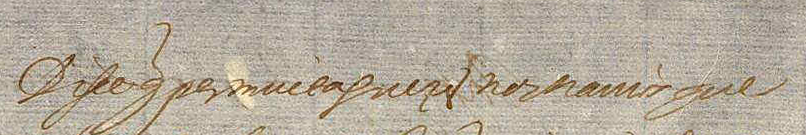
Disse q̄ per muitas uezes nos nauios que
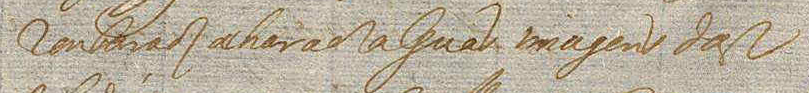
Roubaraõ acharaõ alguās imagens das
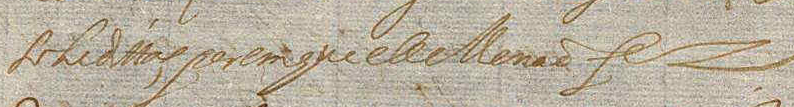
sobredittas, porem que elle lhe naõ fez
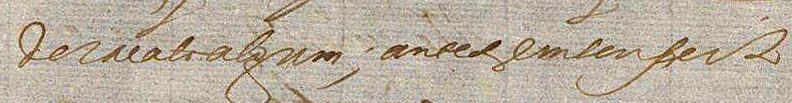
dezacato algum; antes em seu peito
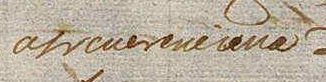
as reuerenciaua
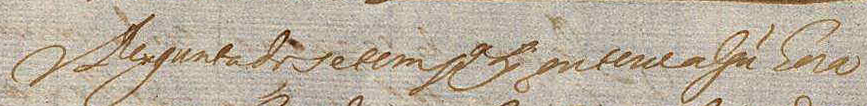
item Perguntado se tem pa sy ou teue algū hora
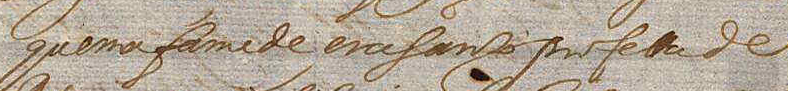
que mafamede era santo profetta de
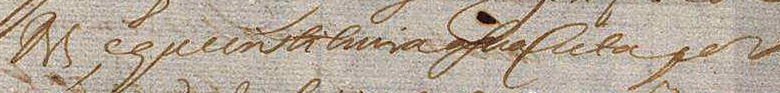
Ds̄, e que instituira a sua Ceita por
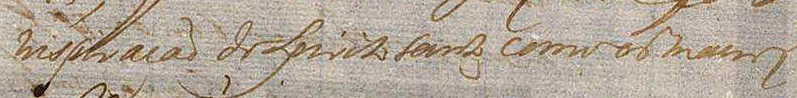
inspiraçaõ do spirito santo como os mouros
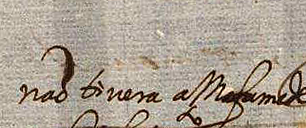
naõ tiuera a Mafamede
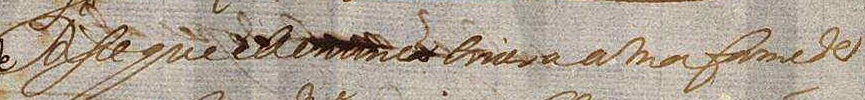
Disse que elle nunca tiuera a mafamede
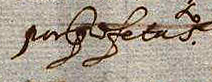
por profeta s.to
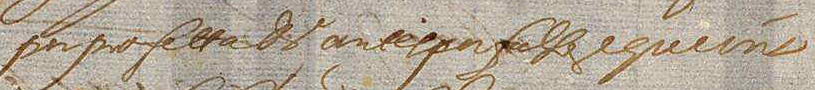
por profetta Ds̄ antes por falso e que ins
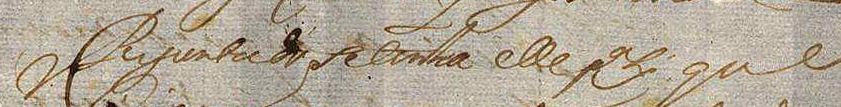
item Perguntado se tinha elle pa sy que
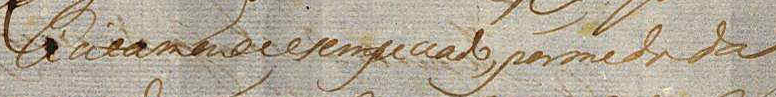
licitamente e sem peccado, por medo da
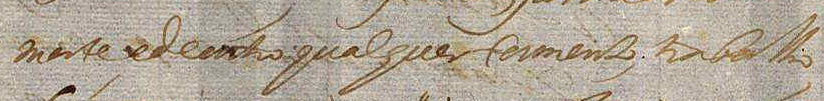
morte, e de outro qualquer tormento, trabalho
